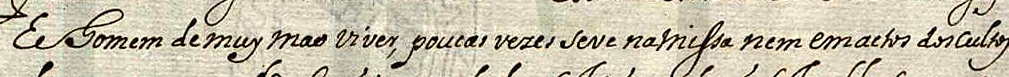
he homem de muy mao viver, poucas vezes se ve na missa nem em actos dos cultos
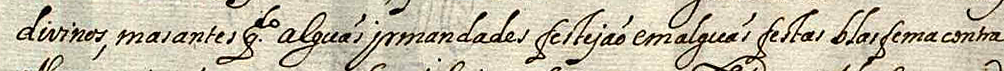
divinos, mas antes q.do alguās jrmandades festejaõ em alguās festas blasfema contra
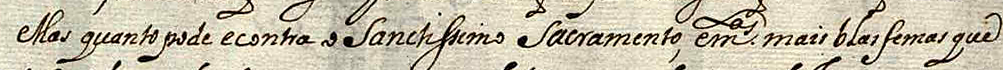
ellas quanto pode e contra o Sanctissimo Sacramento, e mtas mais blasfemas que
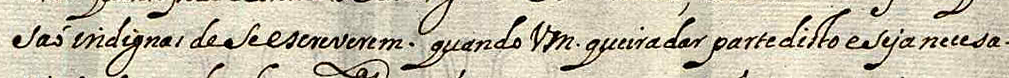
são indignas de se escreverem. quando Vm. queira dar parte disto e seja necesa
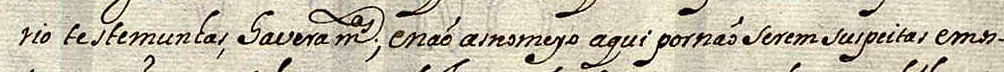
rio testemunhas, havera mtas; e naõ as nomeyo aqui por naõ serem suspeitas e mos
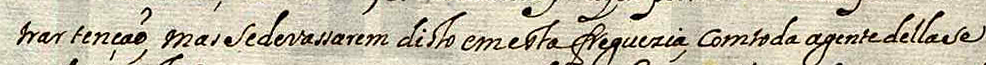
trar tençaõ, mas se devassarem disto em esta freguezia, com toda a gente della se
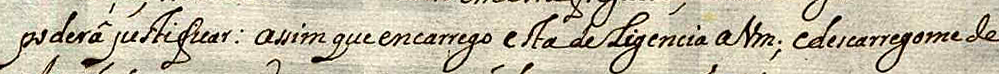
poderâ justificar: assim que encarrego esta deLigencia a Vm; e descarregome de
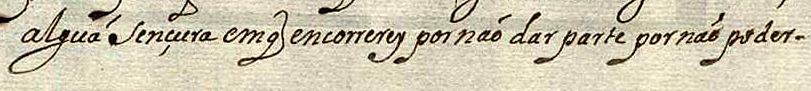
alguā sençura em q̄ encorrerey por naõ dar parte por naõ poder.
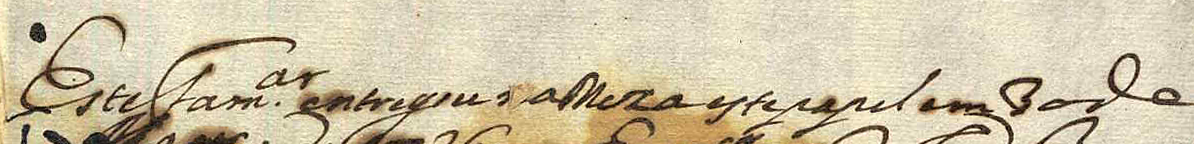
Este Fam.ar entregou na Meza este papel em 30 de
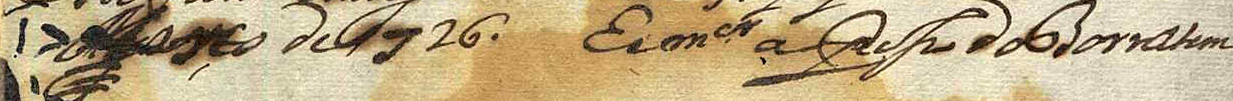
Março de 1726. he m.or a Posso do Borratem
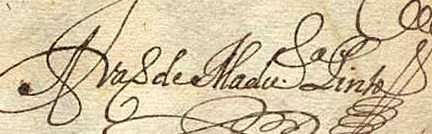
Joaõ de Madu.ra Pinto
